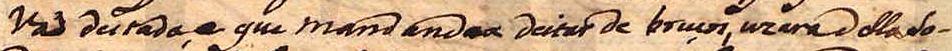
vaõ deitada, e que mandandoa deitar de bruços, uzara della so
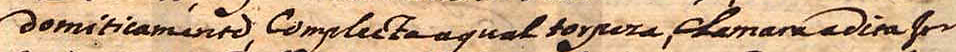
domiticamente, Complecta a qual torpeza, cLamara a dita Jr
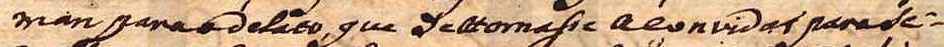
man para o delato, que se a tornasse a convidar para se
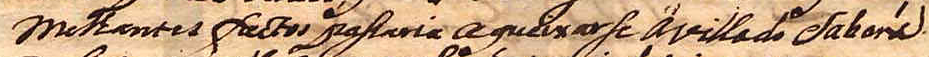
melhantes factos passaria a queixarse a villa do Sabará.
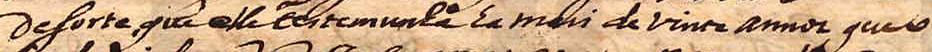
de sorte, que elle testemunha ha mais de vinte annos que o
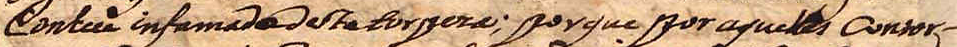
Conhece infamado desta torpeza; porque por aquelles contor
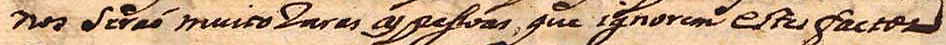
nos seraõ muito Raras as pessoas, que ignorem estes factoz
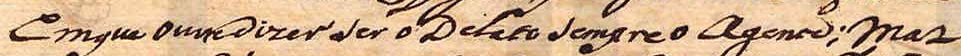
Em que ouve dizer ser o Delato sempre o Agente; maz
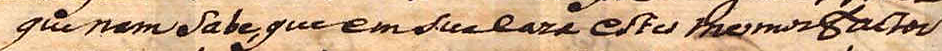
que nam sabe, que em sua caza estes mesmoz factoz
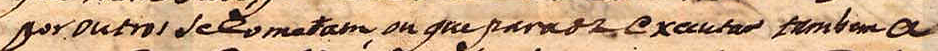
por outros se cometam, ou que para oz executar tambem a
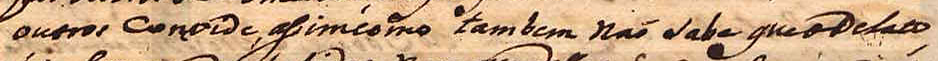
outros convide, assim como tambem naõ sabe que o Delato
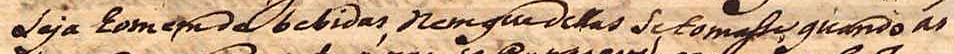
seja homem da bebidas, nem que dellas se tomasse quando ás
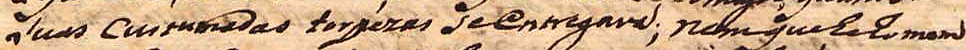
suas custumadas torpezas se entregava; nem que he homem
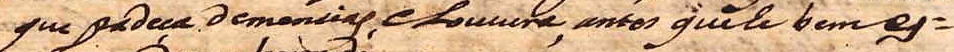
que padeça demencias, e Loucura, antes que he bem es
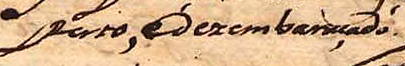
perto, e dezembaraçado.
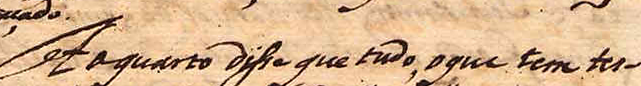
Ao quarto disse que tudo, o que tem tes
